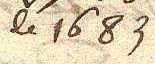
de 1683
